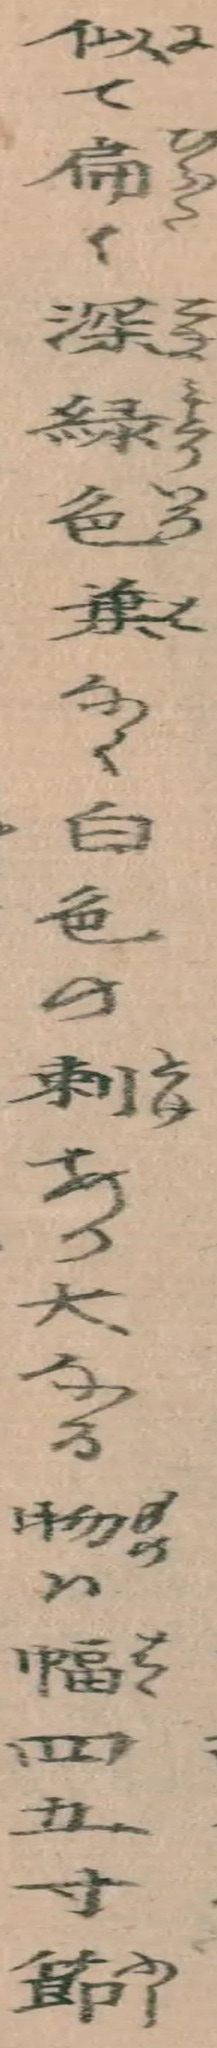似て扁く深緑色葉なく白色の剌あり大なる物は幅四五寸節
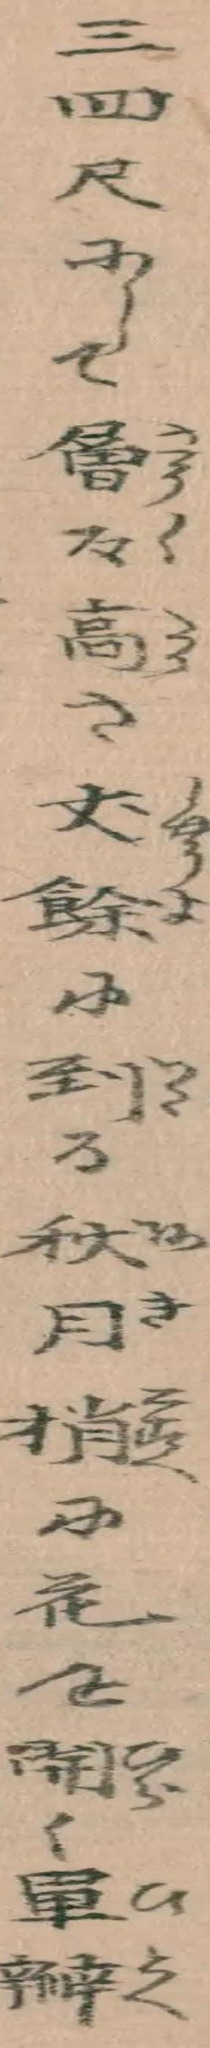三四尺にして層々高さ丈余に到る秋月梢に花を開く単弁
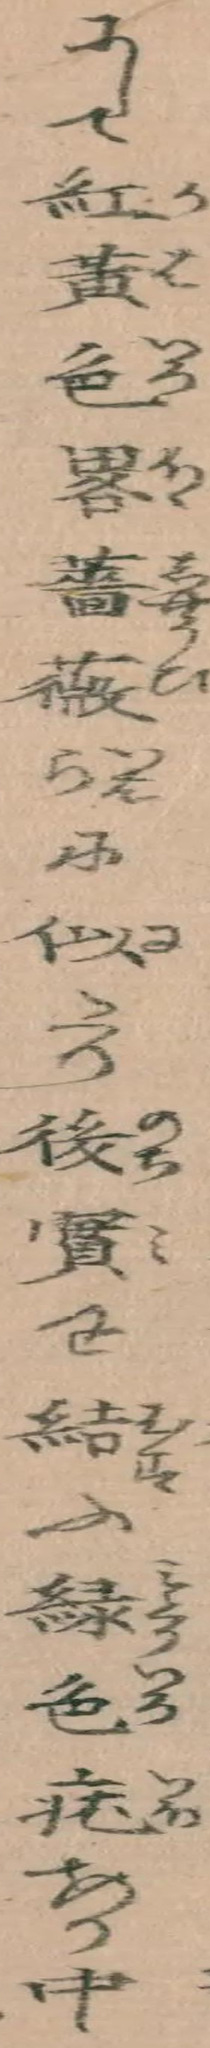にして紅黄色略薔薇いはらに似たり後実を結ふ緑色疣あり中
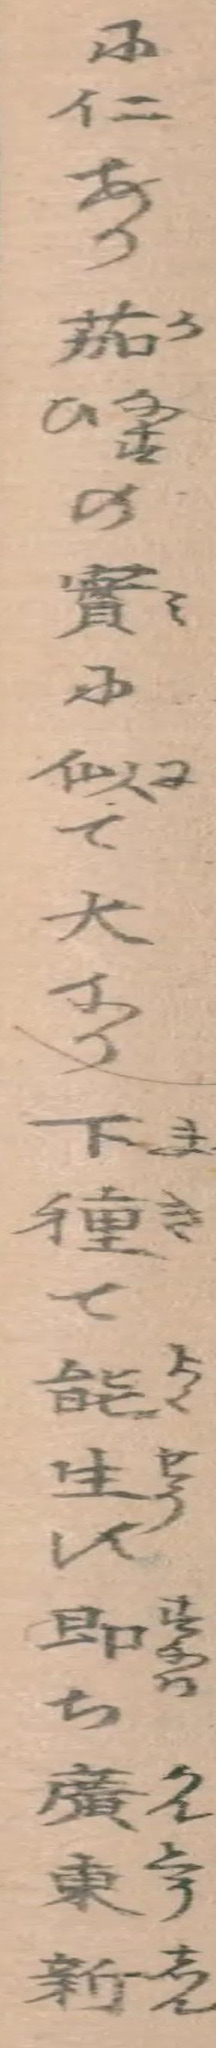に仁あり茄なすひの実に似て大なり下種て能生す即ち広東新
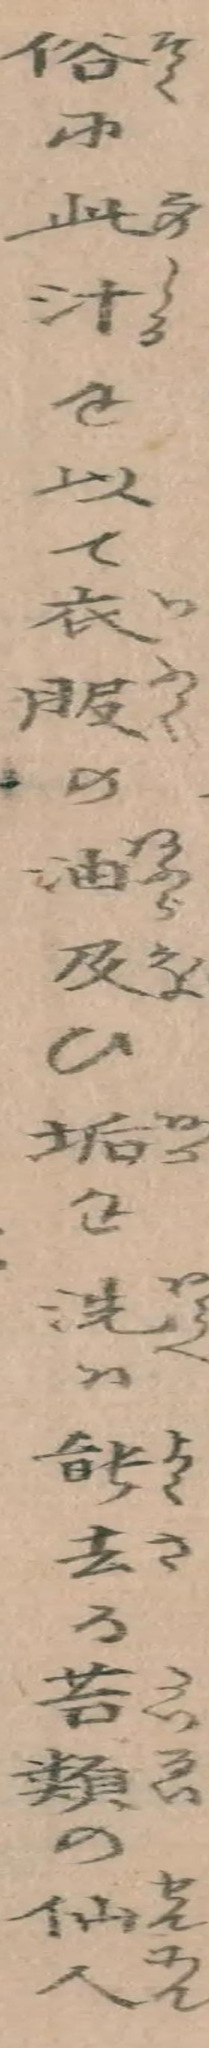俗に此汁を以て衣服の油及ひ垢を洗は能去る苔類の仙人
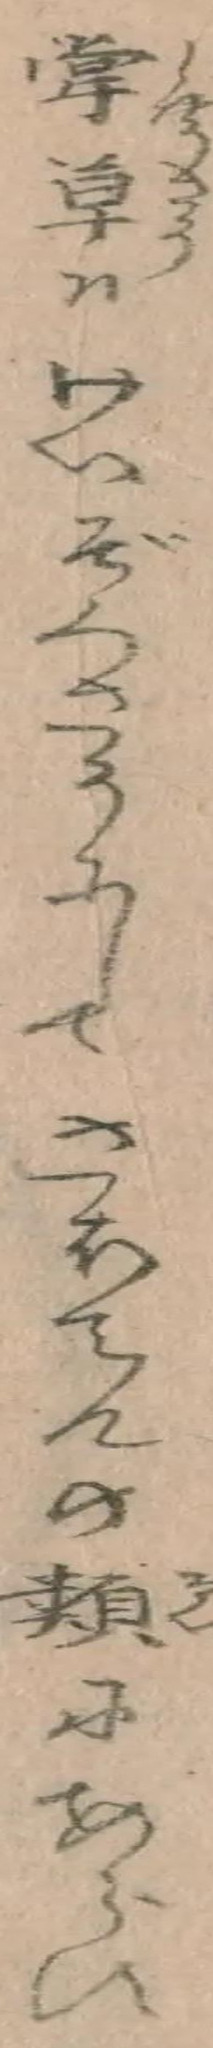掌草はけいぞくさうにしてさほてんの類にあらす
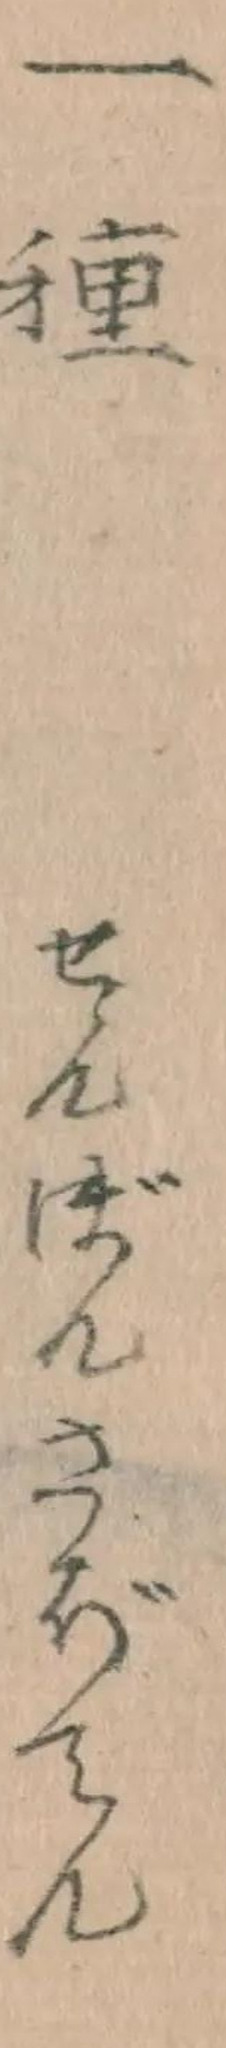一種せんぼんさぼてん
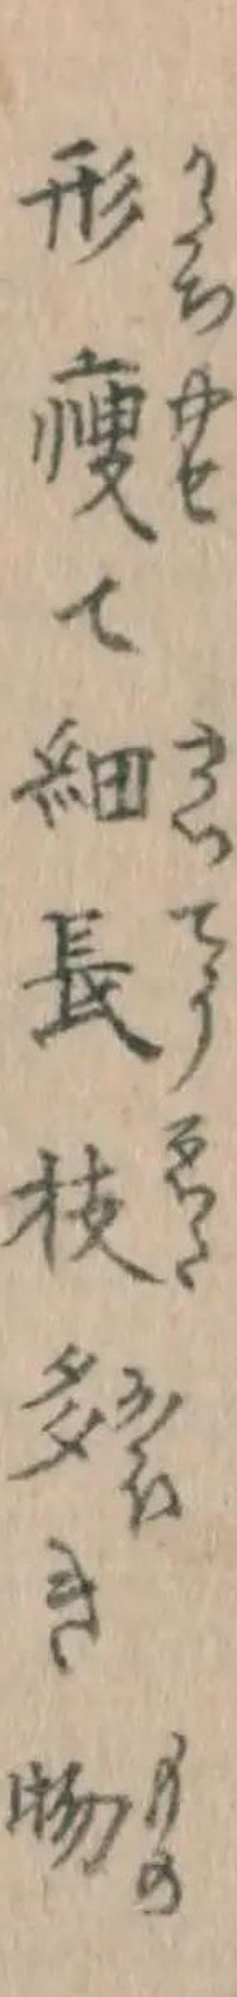形痩て細長枝多き物
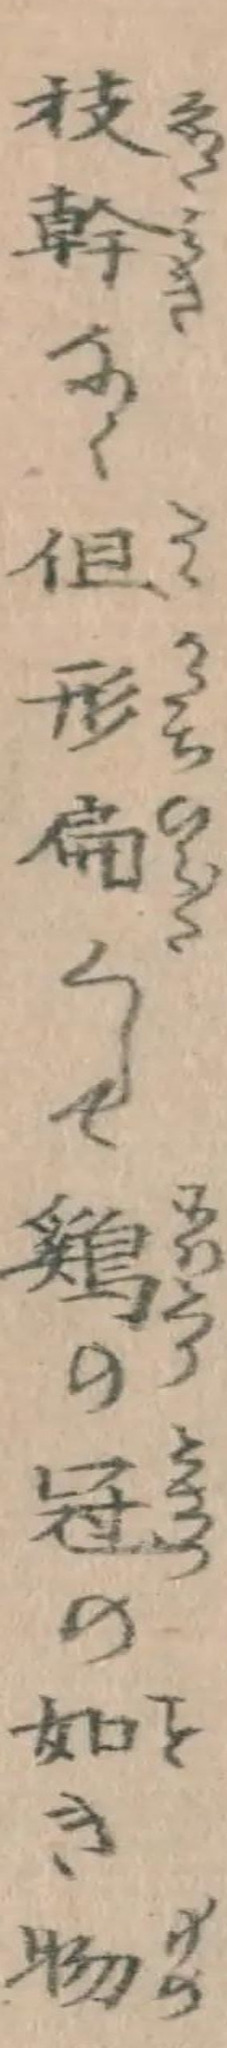枝幹なく但形扁くして鶏の冠の如き物

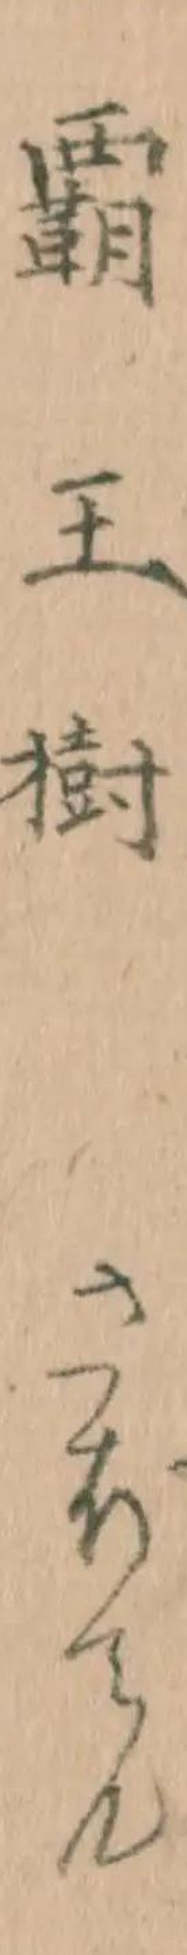覇王樹さぼてん
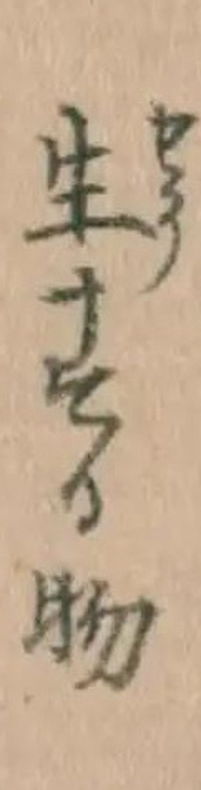生する物
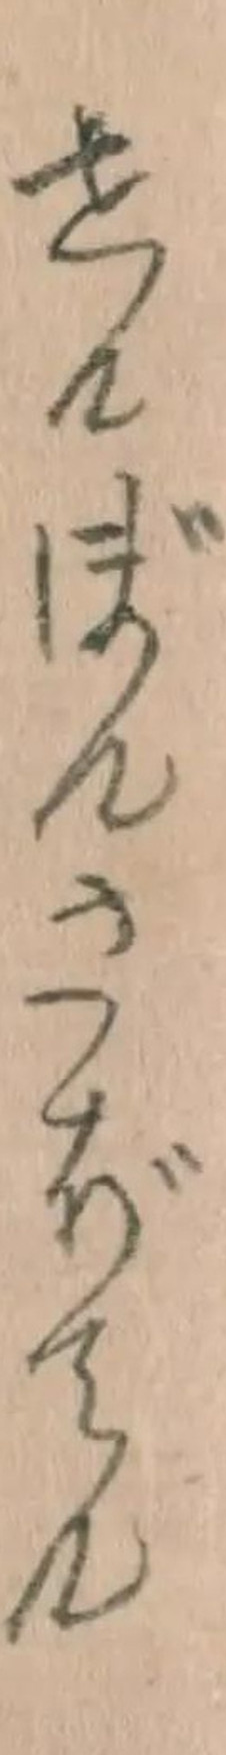せんぼんさぼてん
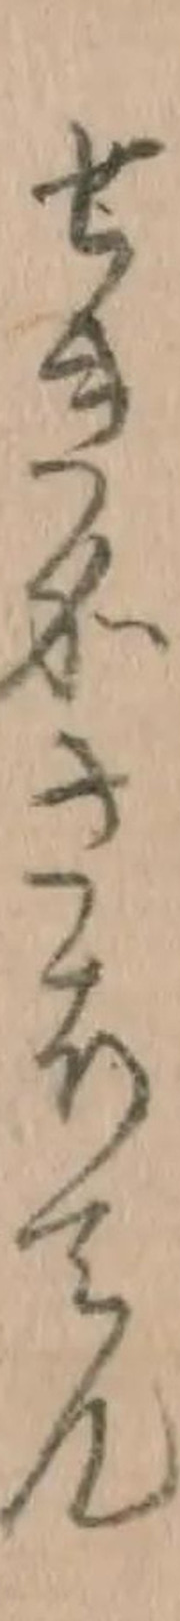せきかさほてん

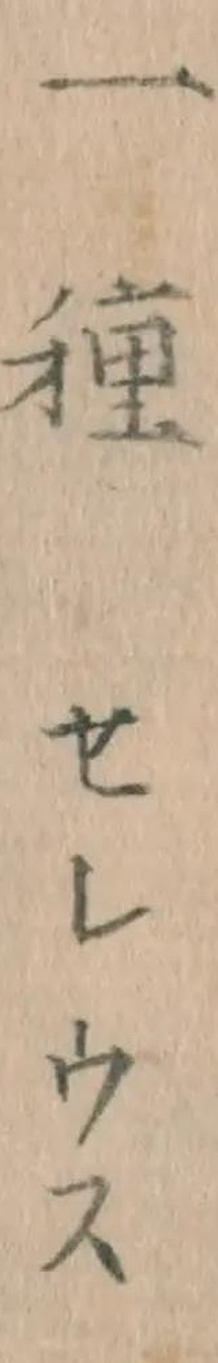一種セレウス
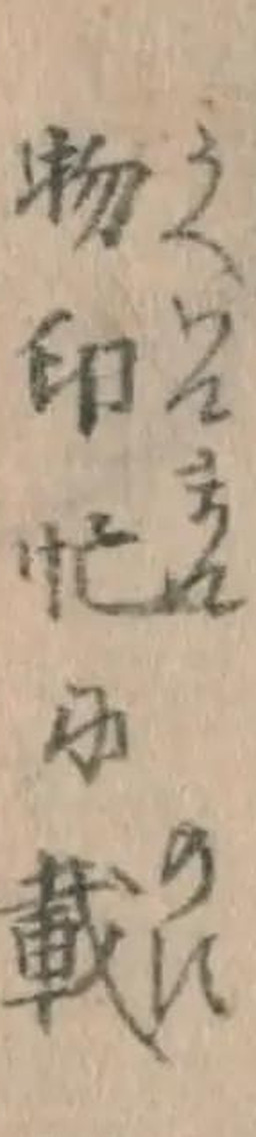物印忙に載
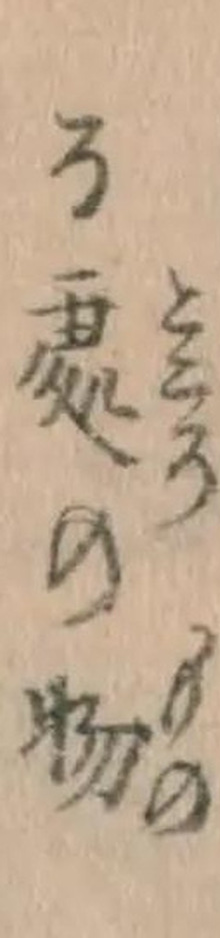る処の物
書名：本草図譜. 巻34-36
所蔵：国立国会図書館 National Diet Library, JAPAN
